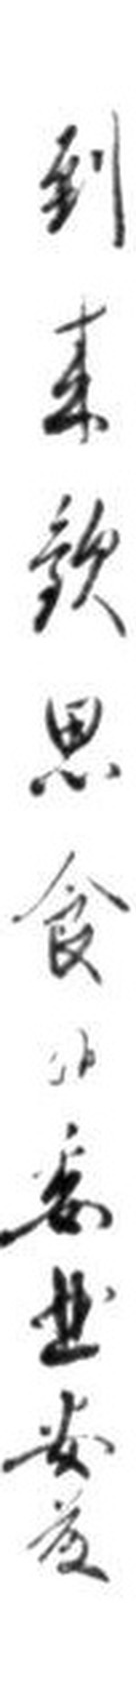到来歓思食候委曲安藤
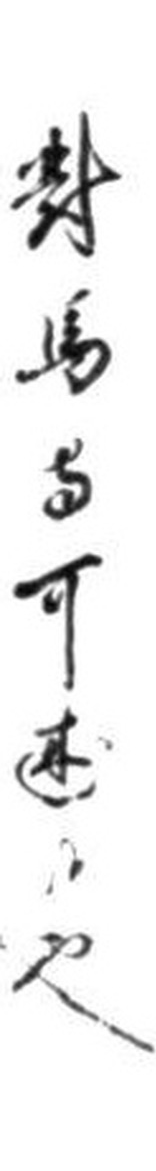対馬守可述候也
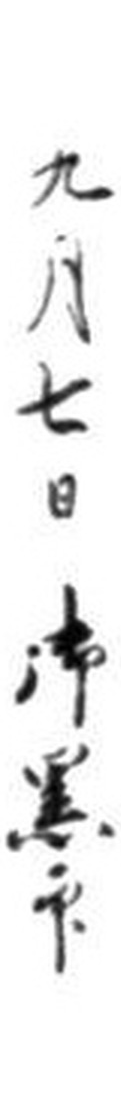九月七日御黒印
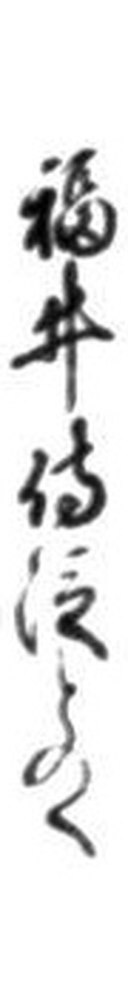福井侍従とのへ
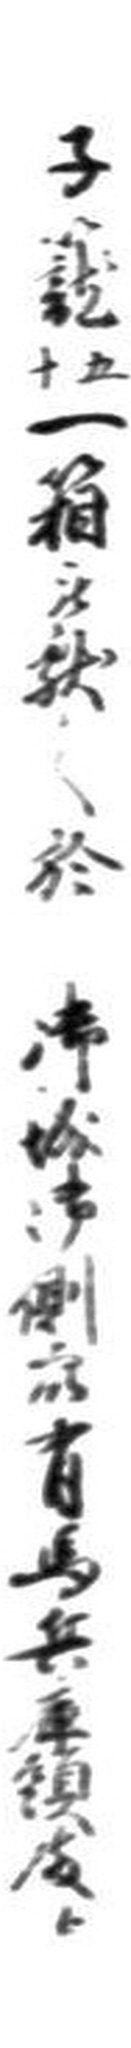十一箱被献之於御城御側衆有馬兵庫頭殿ゟ
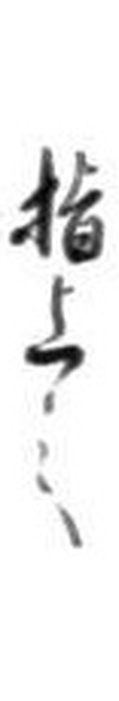指上之
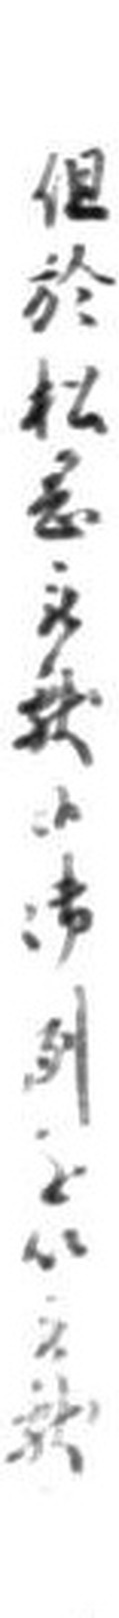但於松岡被献候御例を以被献
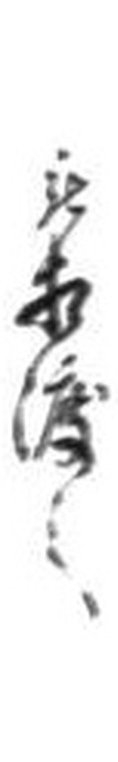被相渡之
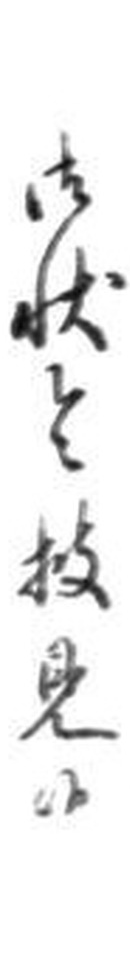御状令披見候
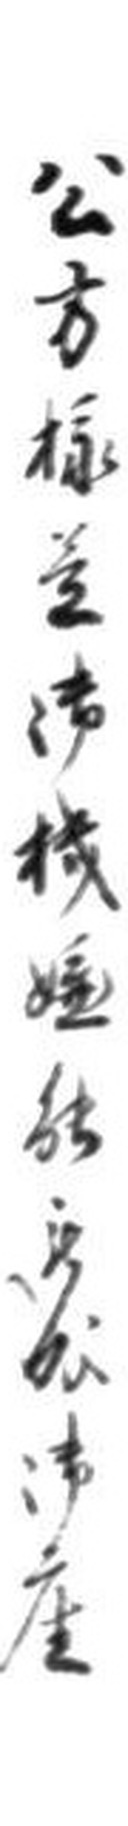公方様益御機嫌能被成御座

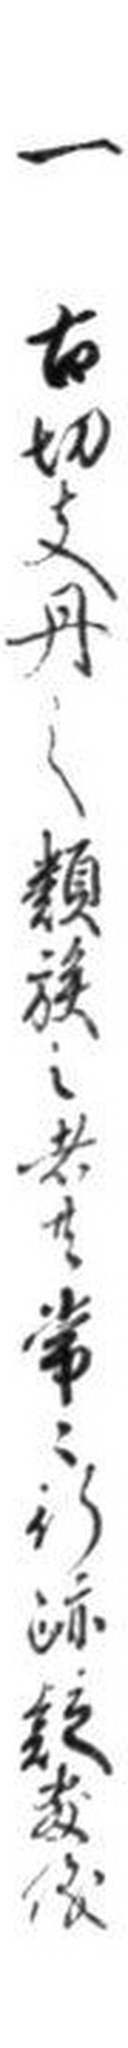一右切支丹之類族之者共常々行跡疑敷儀
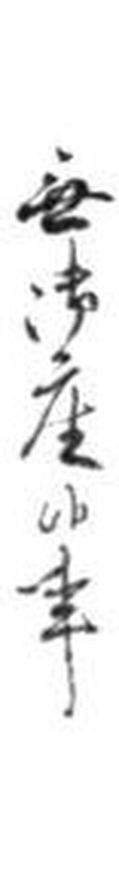無御座候事
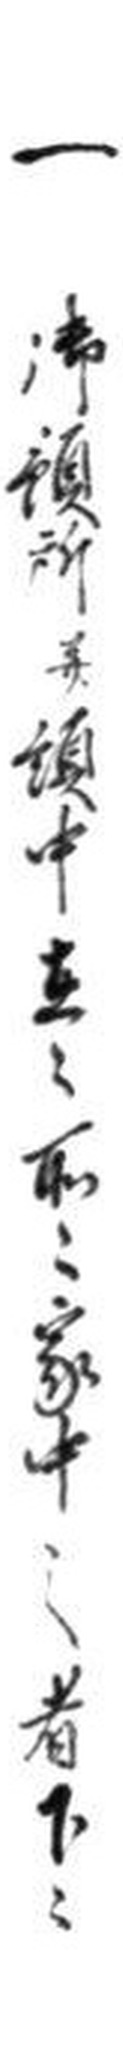一御預所并領中在々所々家中之者下々
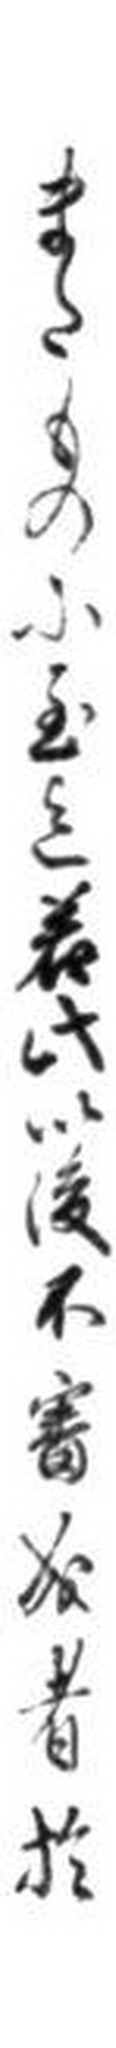またものに至迄若此以後不審成者於
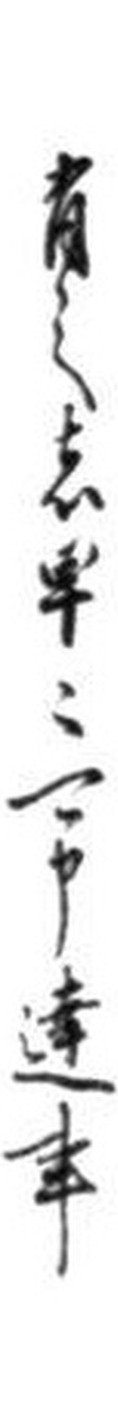有之者早々可申達事
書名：家譜 三十五 宗昌公 従享保六年到同七年
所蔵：福井県文書館 Fukui Prefectural Archives
